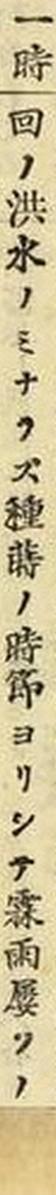回ノ洪水ノミナラズ種蒔ノ時節ヨリシテ霖雨屡ソノ
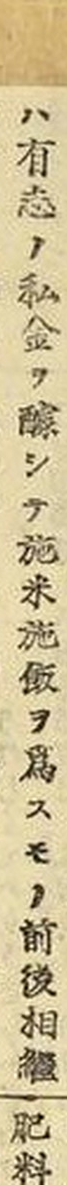ハ有志ノ私金ヲ醵シテ施米施飯ヲ爲スモノ前後相繼
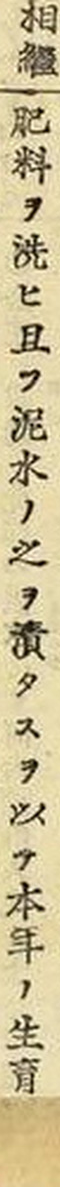肥料ヲ洗ヒ且ツ泥水ノ之ヲ漬タスヲ以テ本年ノ生育
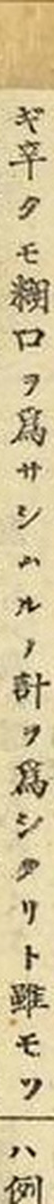ギ辛クモ糊口ヲ爲サシムルノ計ヲ爲シタリト雖モソ
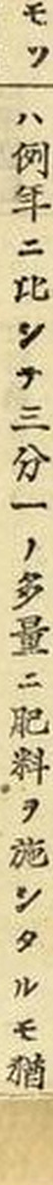ハ例年ニ比シテ三分一ノ多量ニ肥料ヲ施シタルモ猶
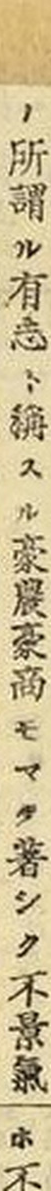ノ所謂ル有志ト稱スル豪農豪商モマタ著シク不景氣
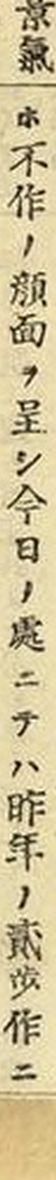ホ不作ノ顔面ヲ呈シ今日ノ處ニテハ昨年ノ貮歩作ニ
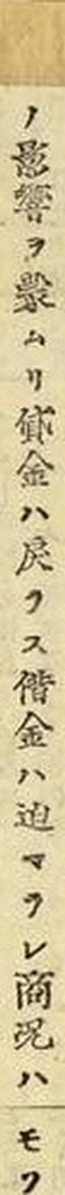ノ影響ヲ蒙ムリ貸金ハ戻ラス借金ハ迫マラレ商况ハ
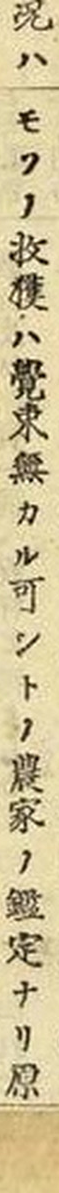モソノ収穫ハ覺束無カル可シトノ農家ノ鑑定ナリ原
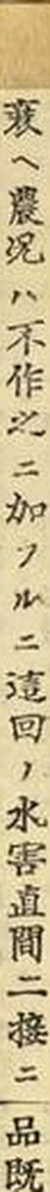衰ヘ農况ハ不作之ニ加フルニ這回ノ水害直間ニ接ニ
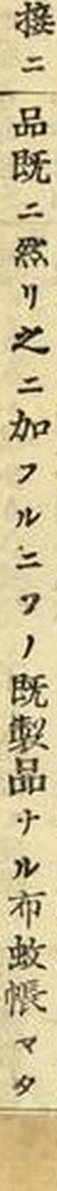品既ニ然リ之ニ加フルニソノ既製品ナル布蚊帳マタ
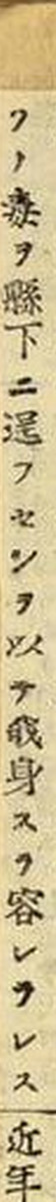ソノ毒ヲ縣下ニ逞フセンヲ以テ我身スラ容レラレス
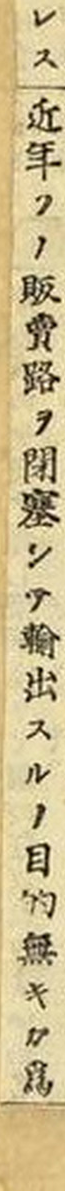近年ソノ販賣路ヲ閉塞シテ輸出スルノ目的無キガ爲

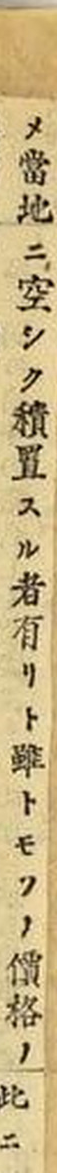メ當地ニ空シク積置スル者有リト雖トモソノ價格ノ
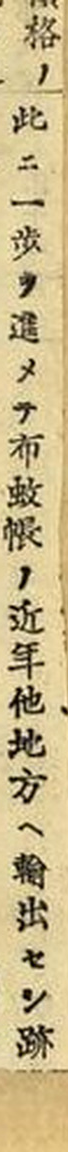此ニ一歩ヲ進メテ布蚊帳ノ近年他地方ヘ輸出セシ跡
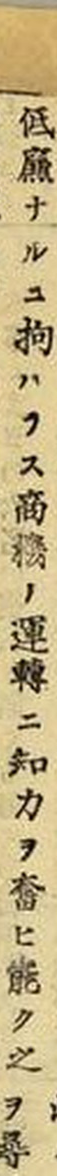低廉ナルニ拘ハラス商機ノ運轉ニ知力ヲ奮ヒ能ク之
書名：温古集 五巻
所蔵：福井県文書館 Fukui Prefectural Archives
